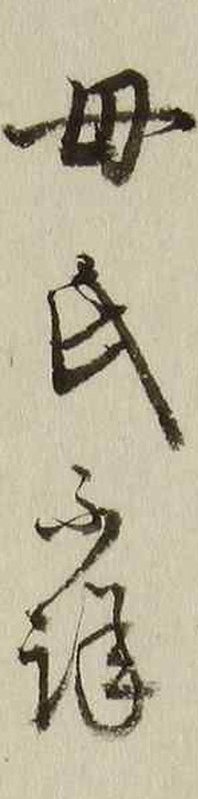母氏不詳
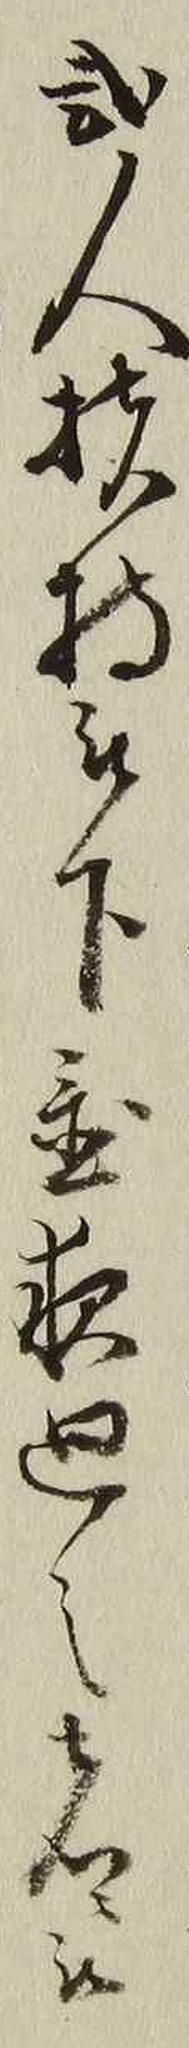弐人扶持被下置夜廻之者ニ被
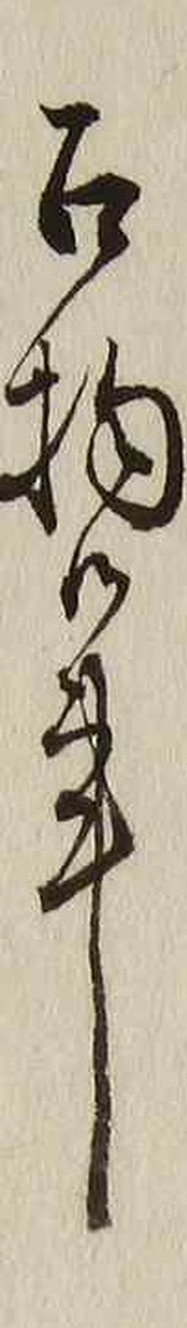召抱候事
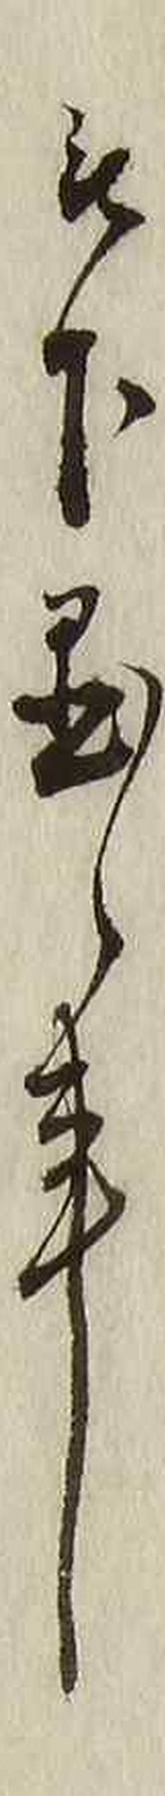被下置候事
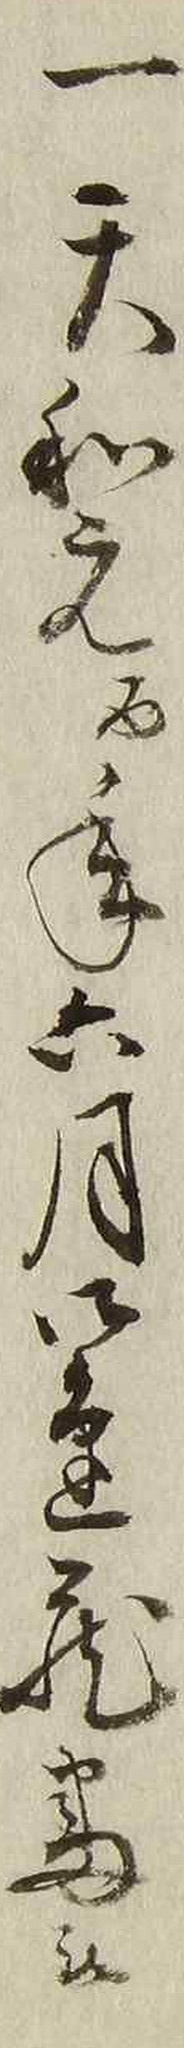一天和元酉年六月御金蔵番被
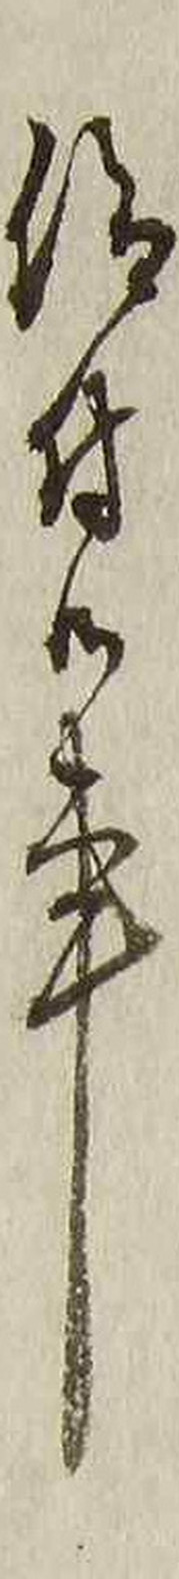仰付候事
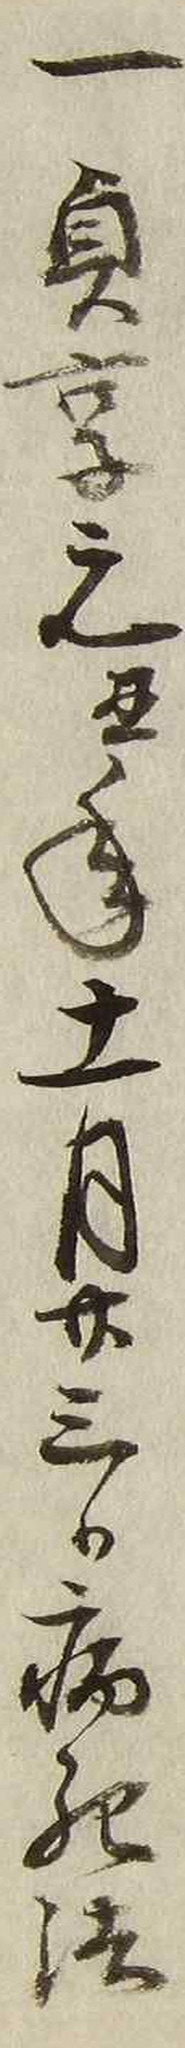一貞享元丑年十一月廿三日病死法
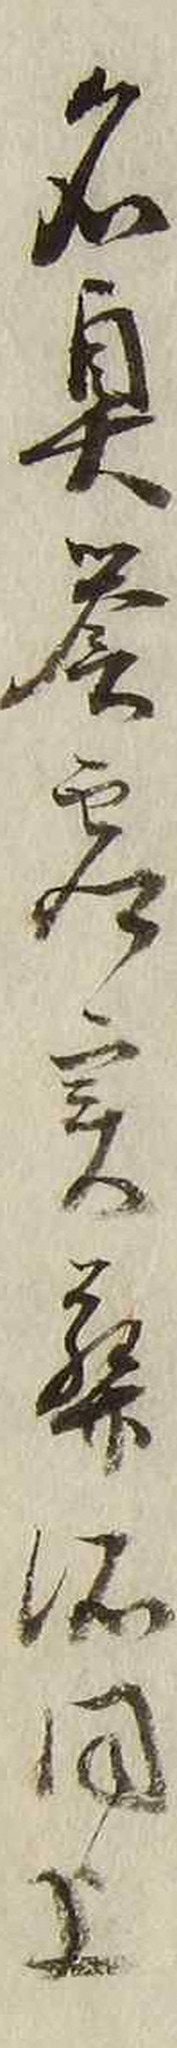名貞誉虚実葬所同上

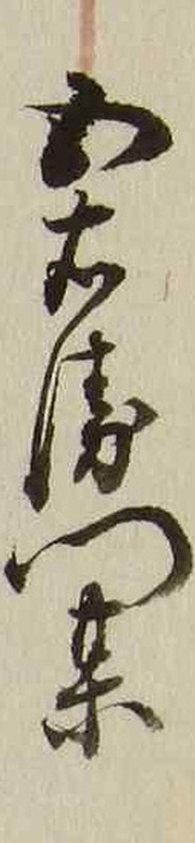五右衛門某
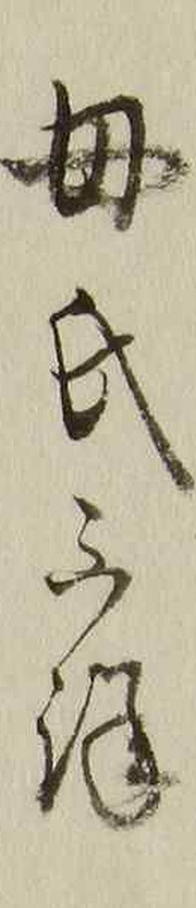母氏不詳
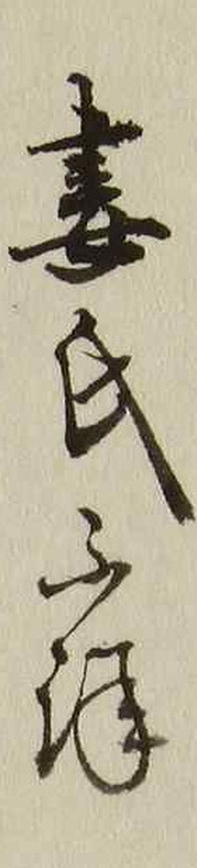妻氏不詳
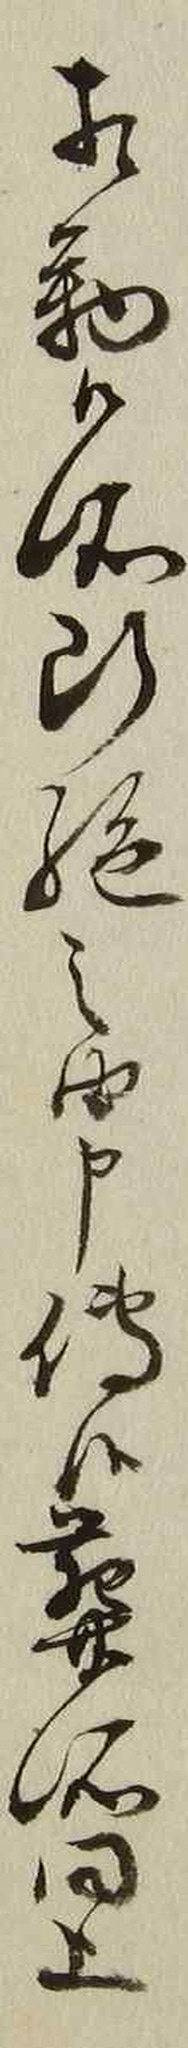相勤候所断絶之由伝候葬所同上
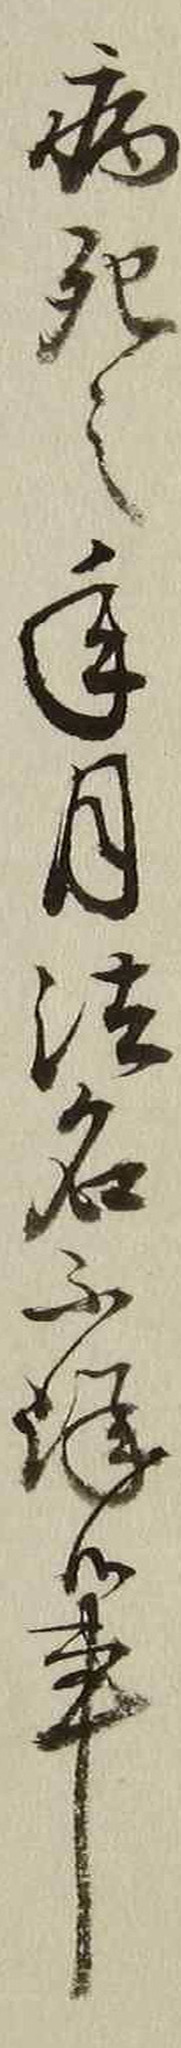病死之年月法名不詳候事
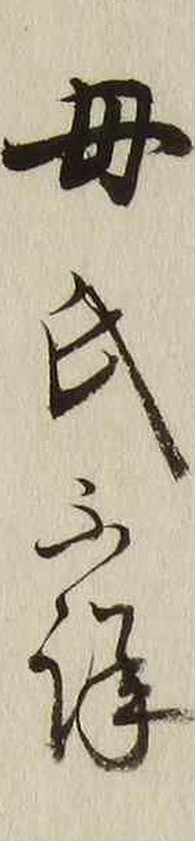母氏不詳
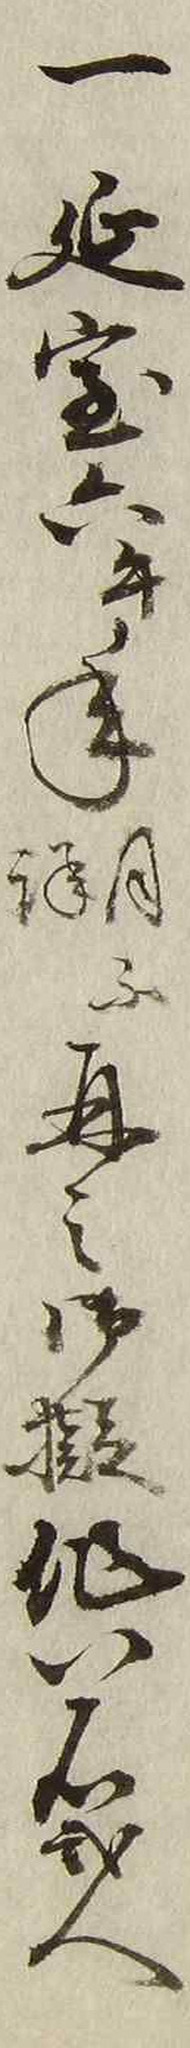一延宝六午年月不詳再之御擬作八石弐人
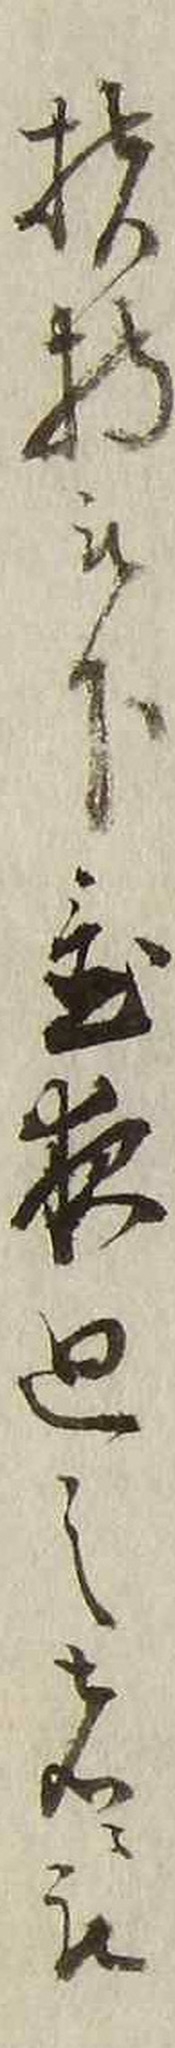扶持被下置夜廻之者ニ被
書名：諸士系譜　巻之36　は之部4
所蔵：会津若松市立会津図書館
